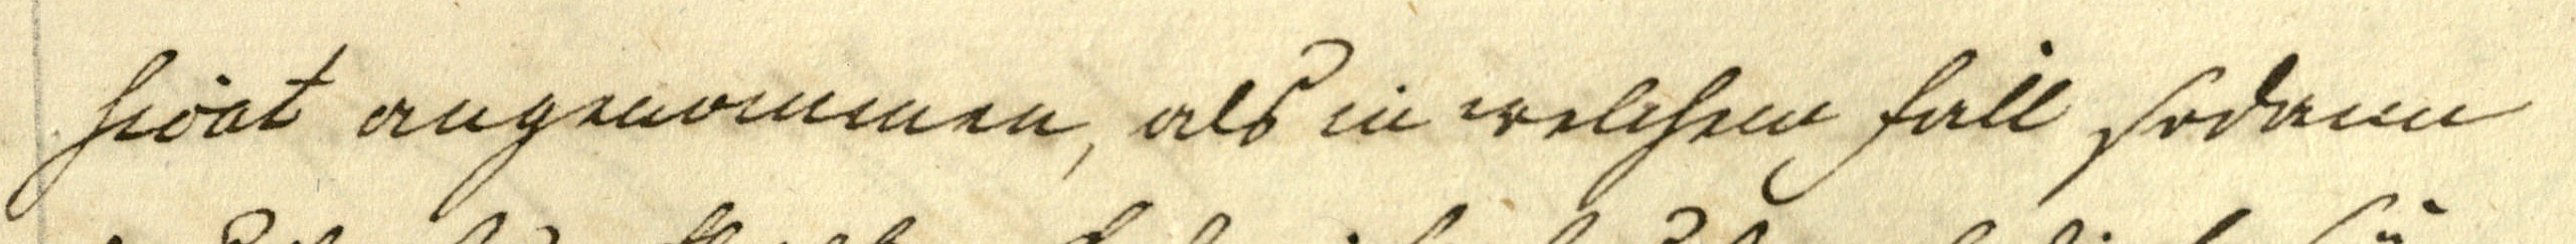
sicat angenommen, als in welchem Fall sodann
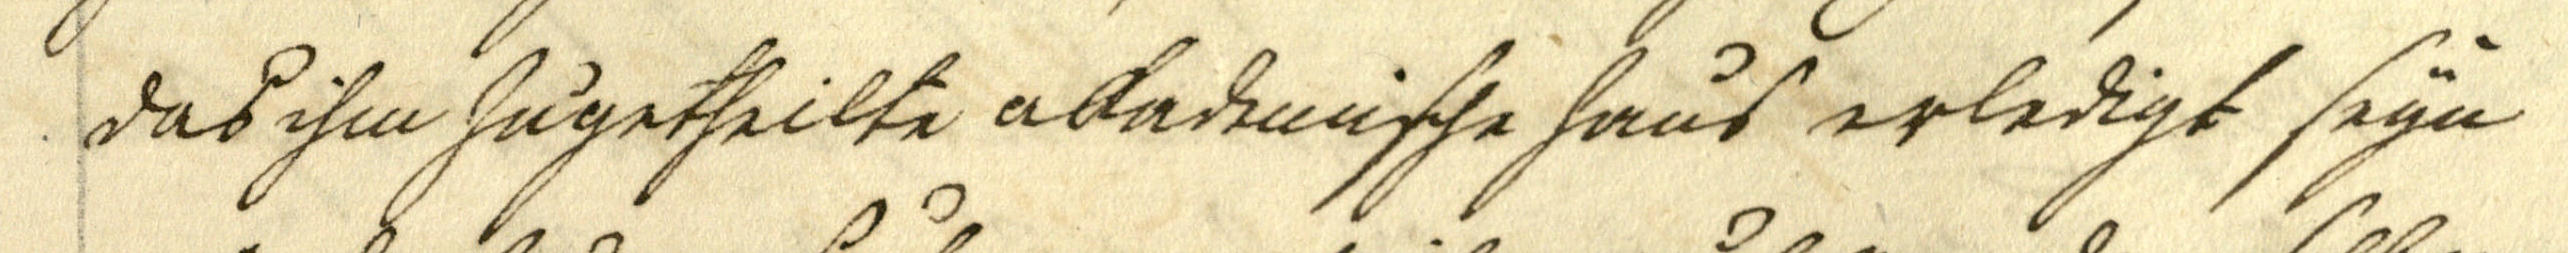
das ihm zugetheilte akademische Haus erledigt seÿn
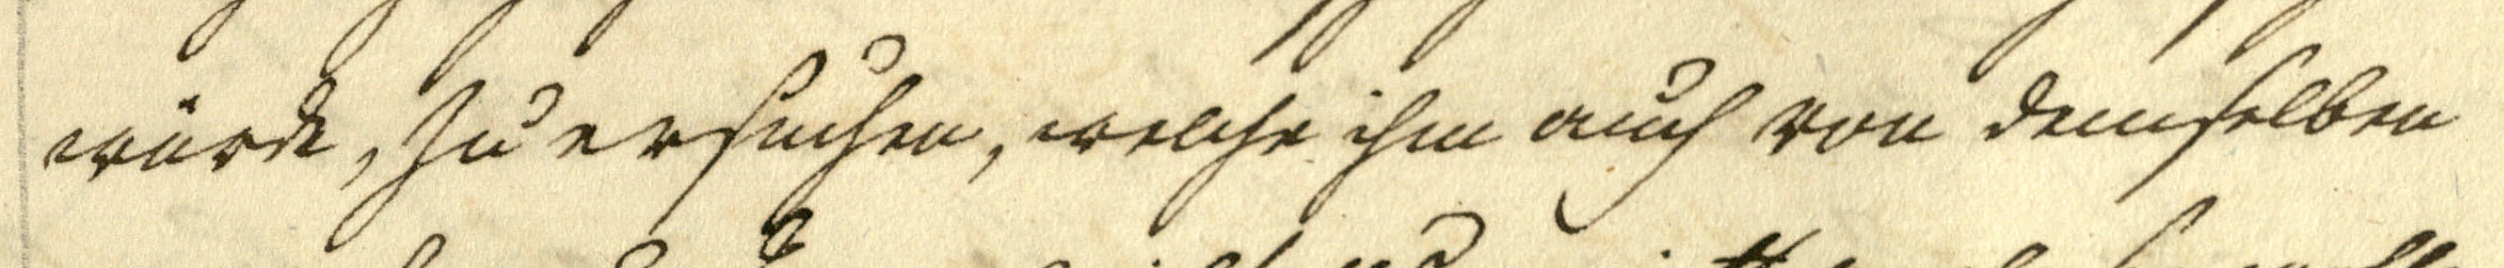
würde, zu ersuchen, welche ihm auch von demselben
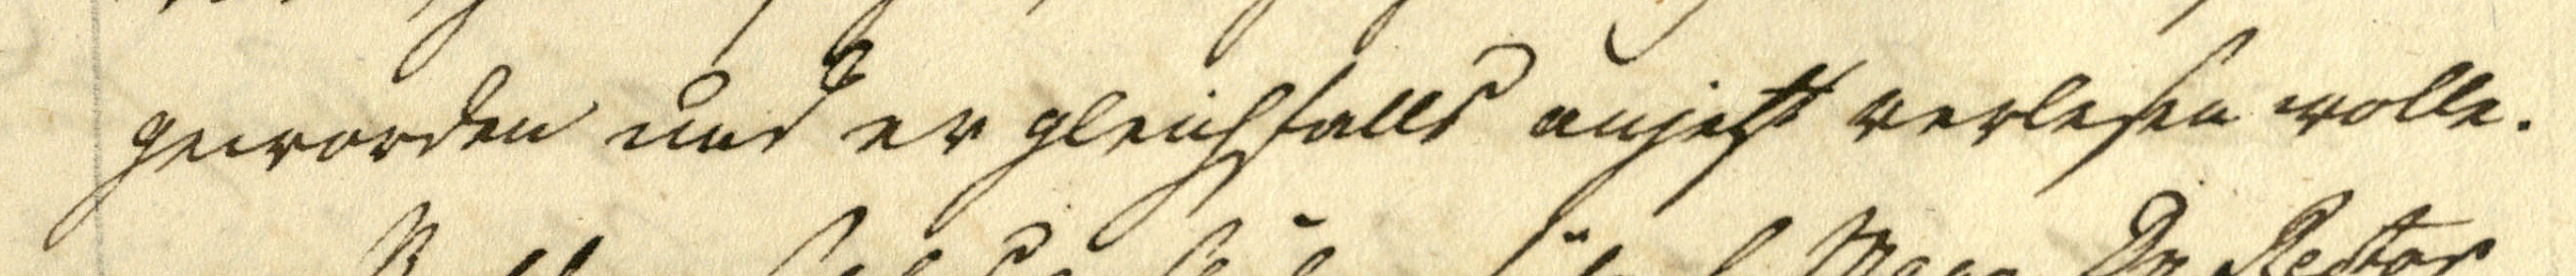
geworden und er gleichfalls anjetzt verlesen wolle.
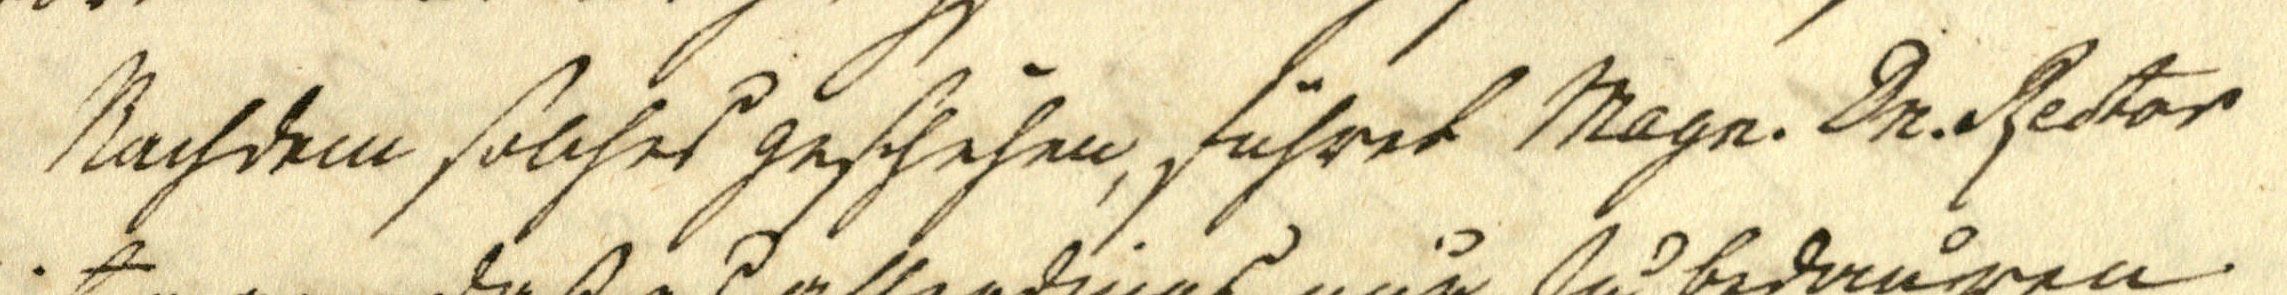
Nachdem solches geschehen, führet Magn. Dn. Rector
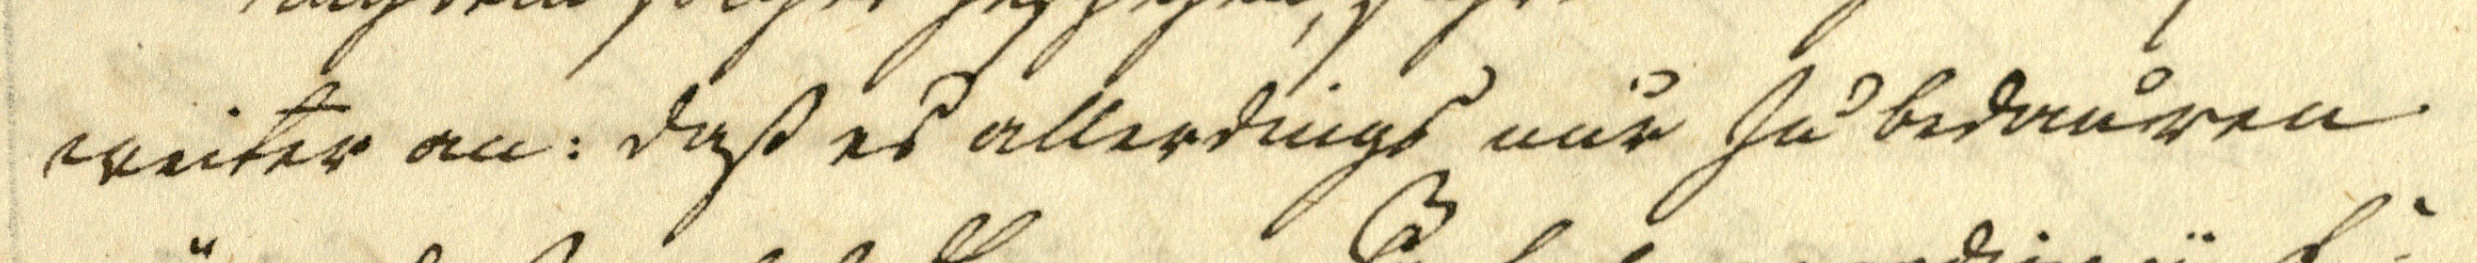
weiter an: daß es allerdings nur zu bedauren
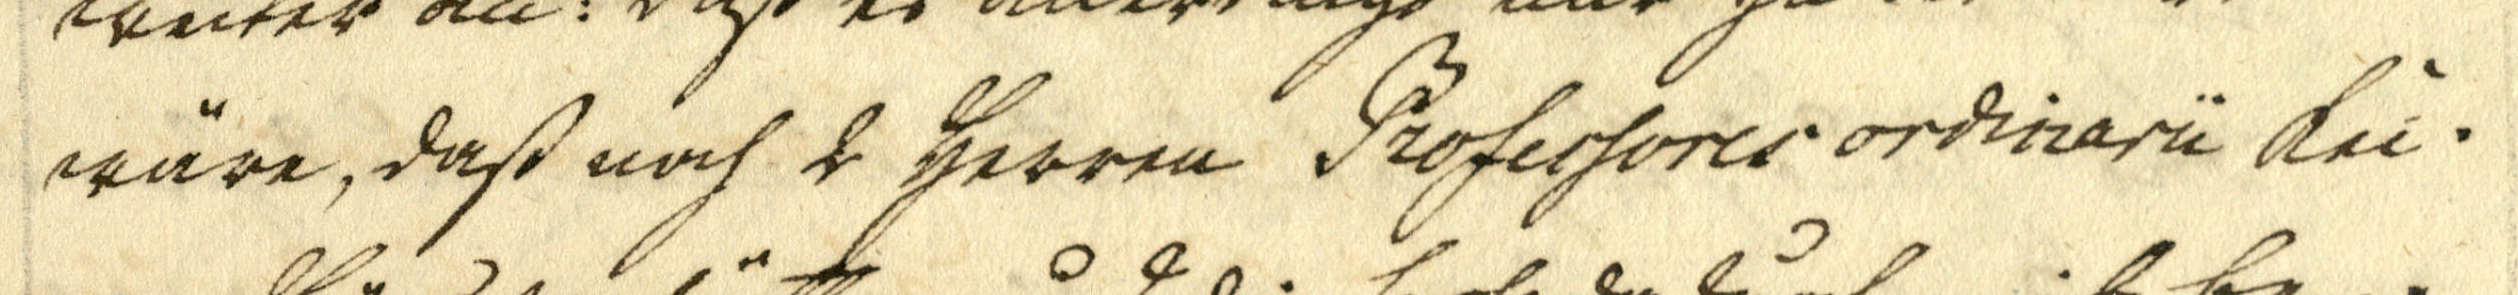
wäre, daß noch 2 Herren Professores ordinarii kei¬
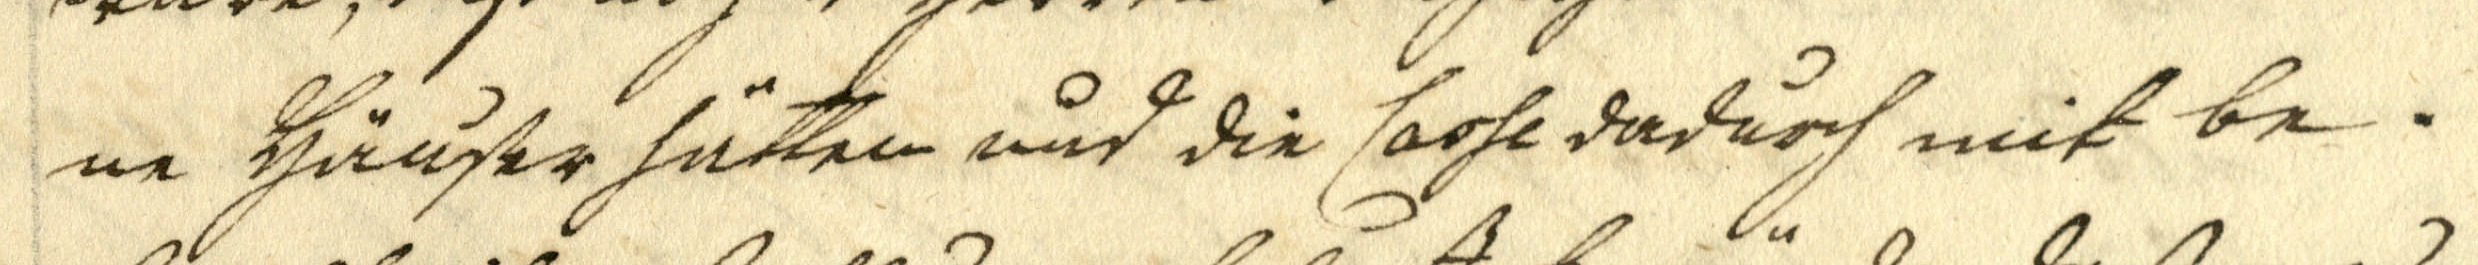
ne Häuser hätten und die Casse dadurch mit be¬
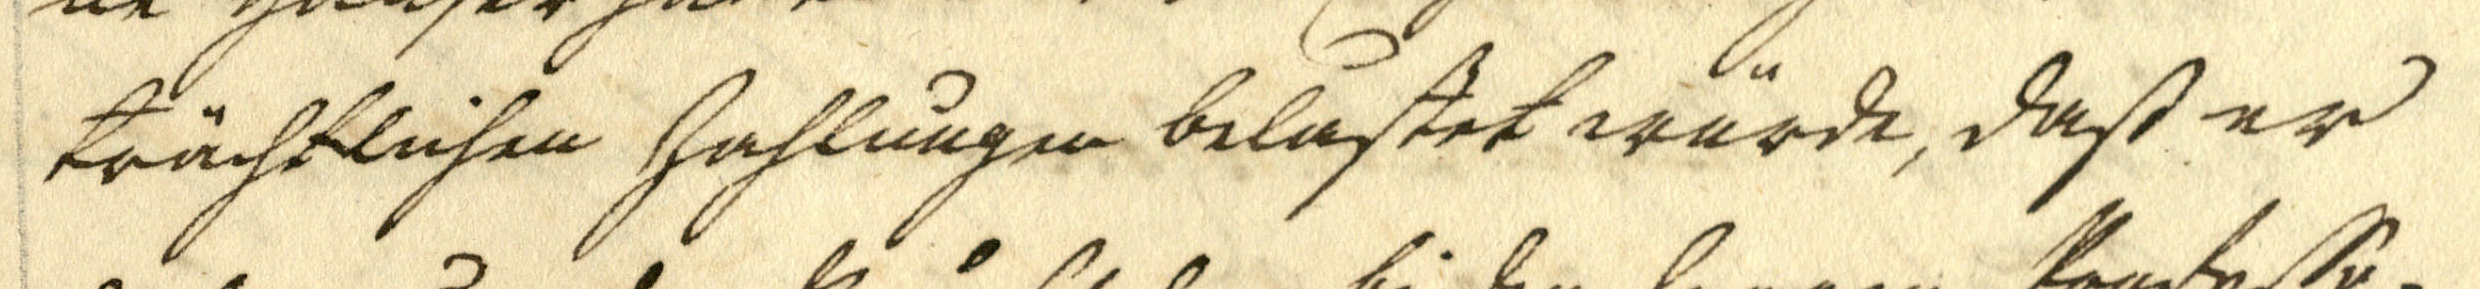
trächtlichen Zahlungen belastet würde, daß er
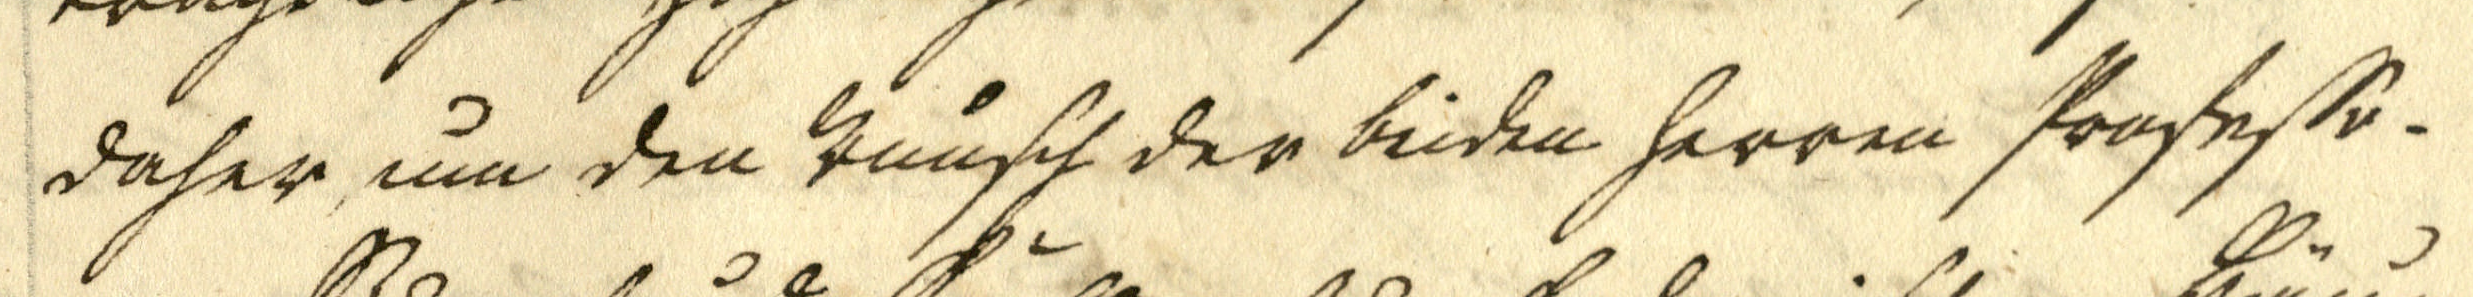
daher um den Wunsch der beiden Herren Professo¬
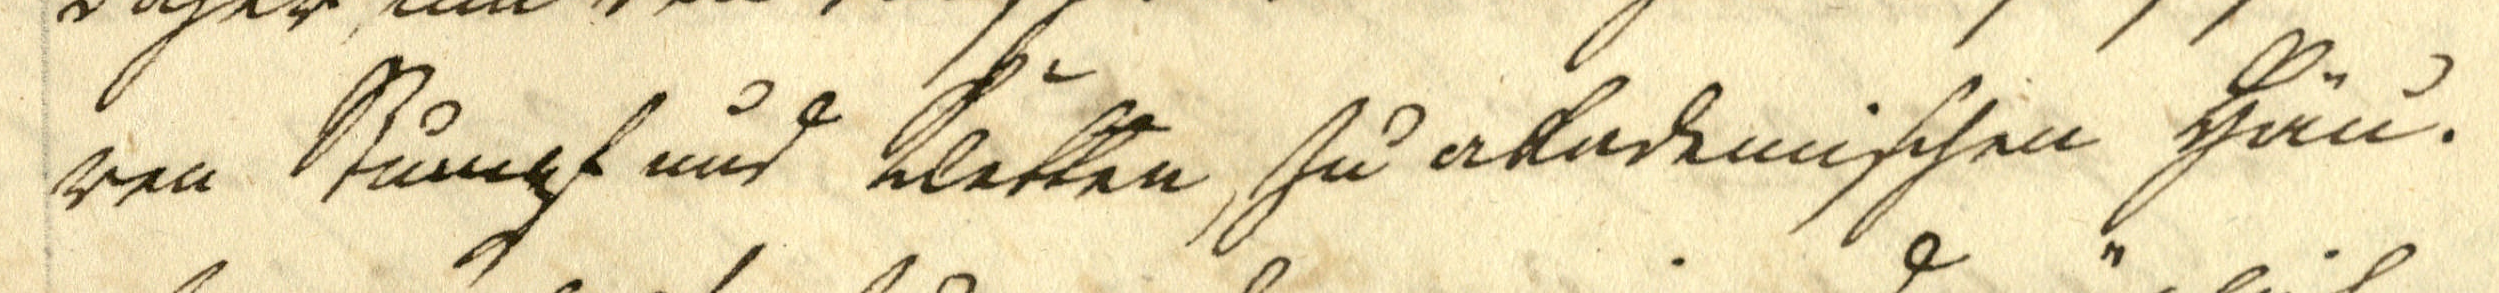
ren Stumpf und Kletten, zu akademischen Häu¬
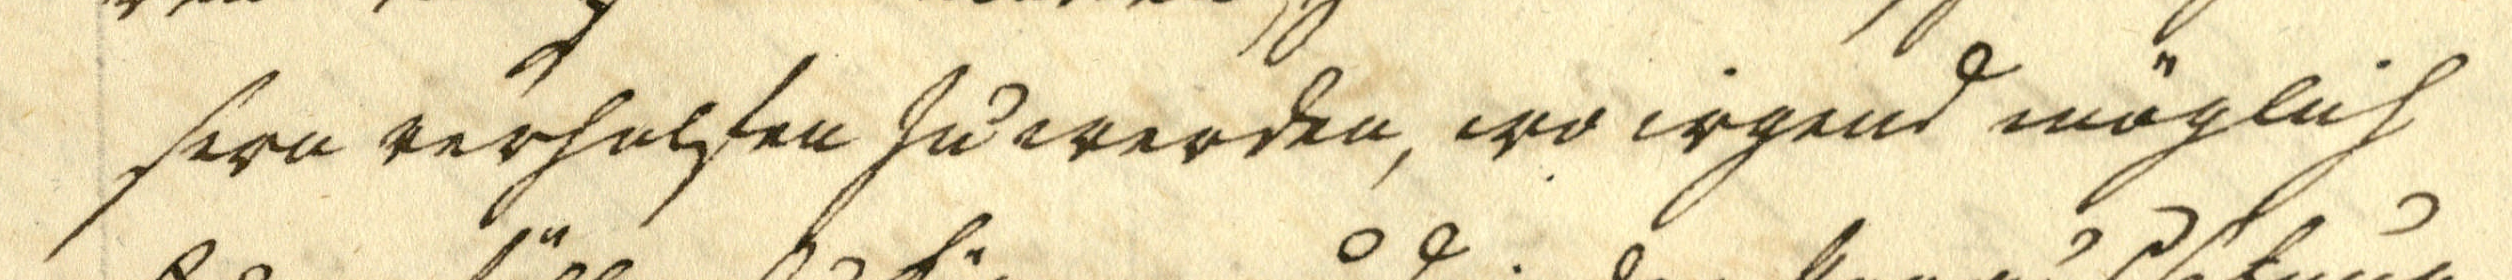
sern verholfen zu werden, wo irgend möglich
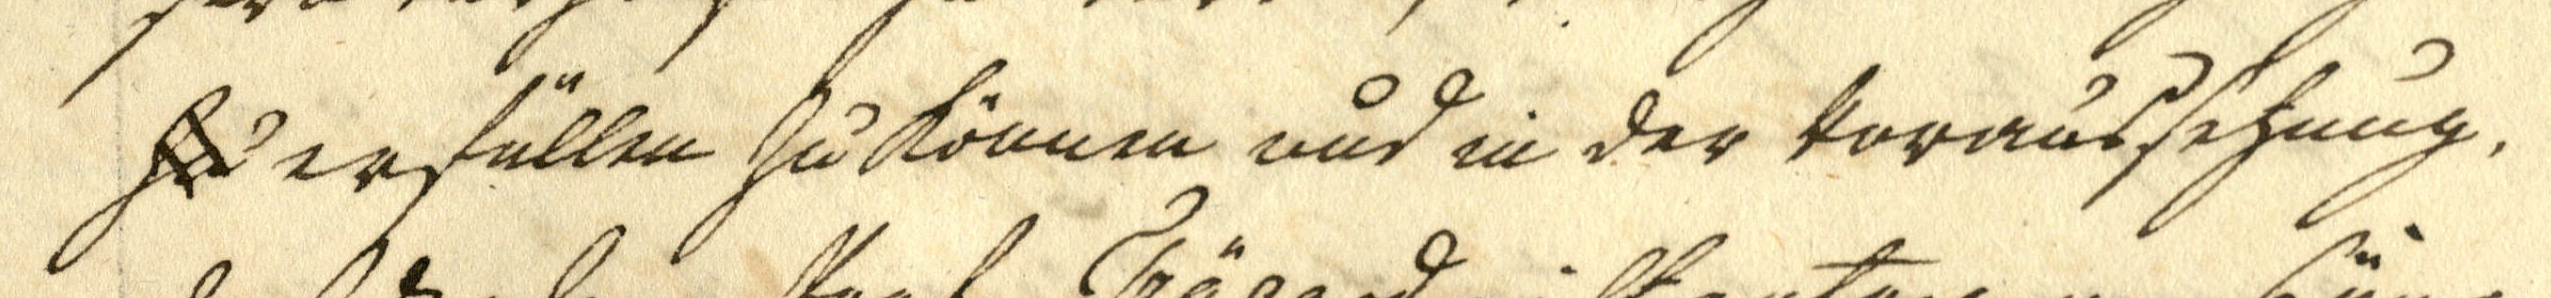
zu erfüllen zu können und in der Voraussetzung,
